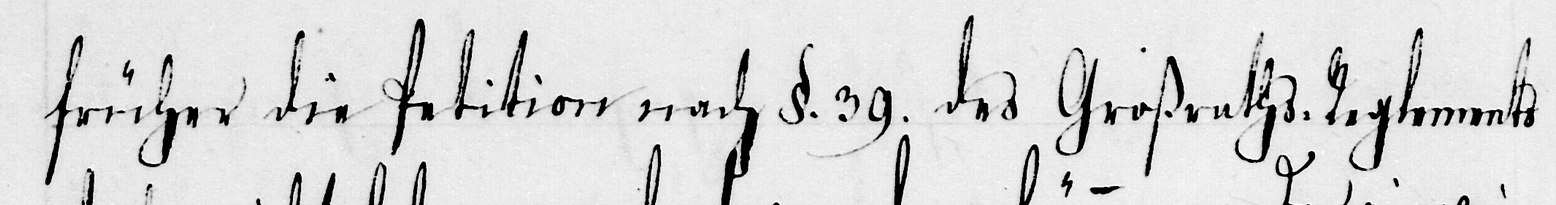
früher die Petition nach §. 39. des Großraths-Reglements
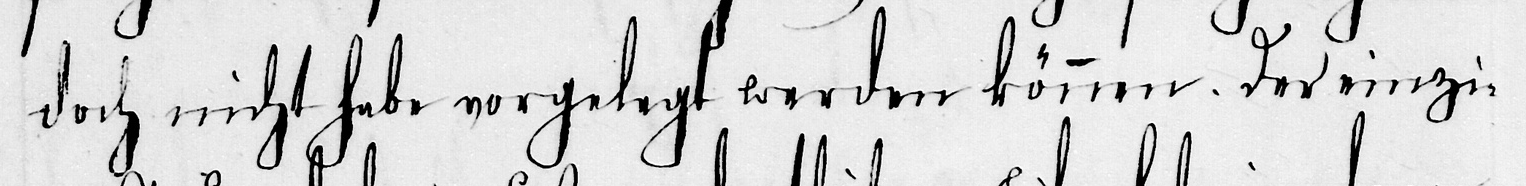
doch nicht habe vorgelegt werden können. Der einzi¬
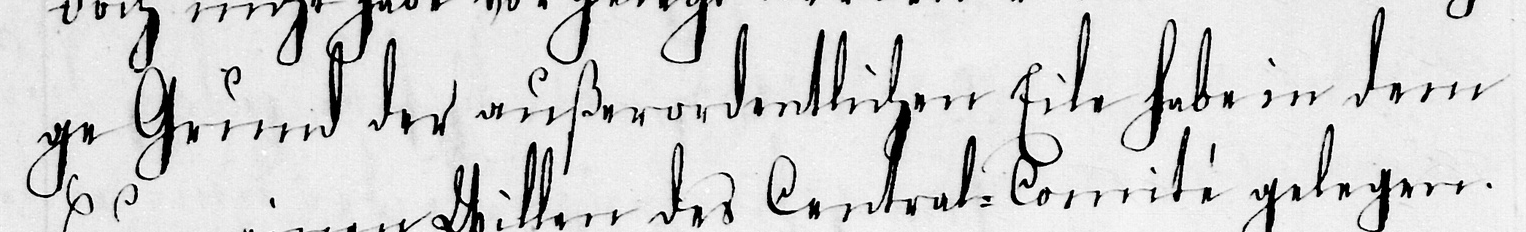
ge Grund der außerordentlichen Eile habe in dem
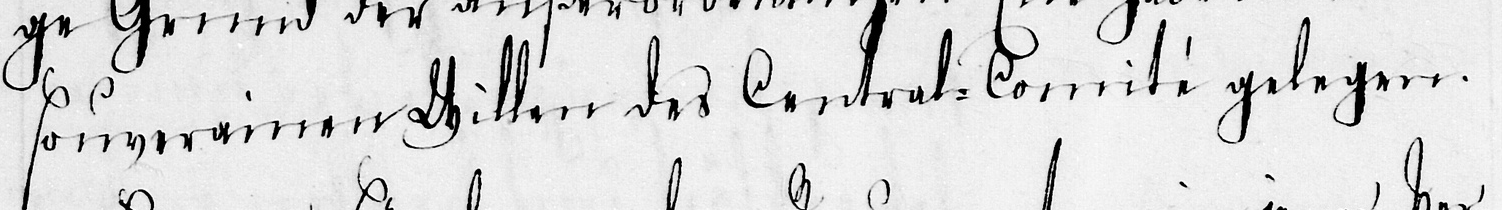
souverainen Willen des Central-Comité gelegen.
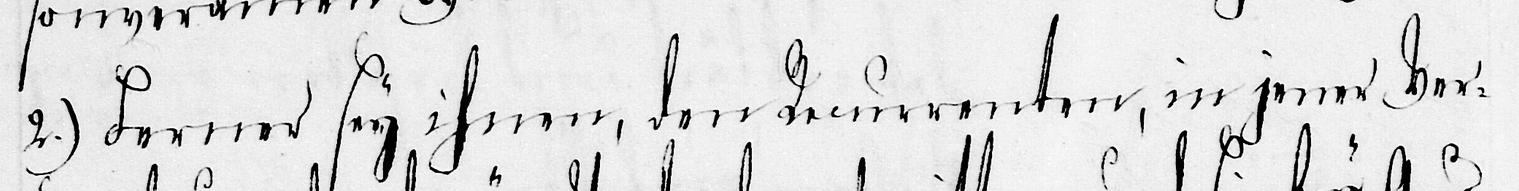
2.) Ferner sey ihnen, den Recurrenten, in jener Ver¬
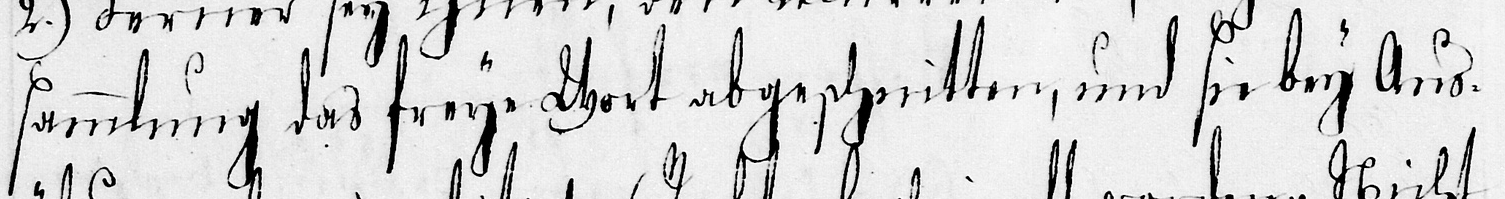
sammlung das freye Wort abgeschnitten, und sie bey Aus¬
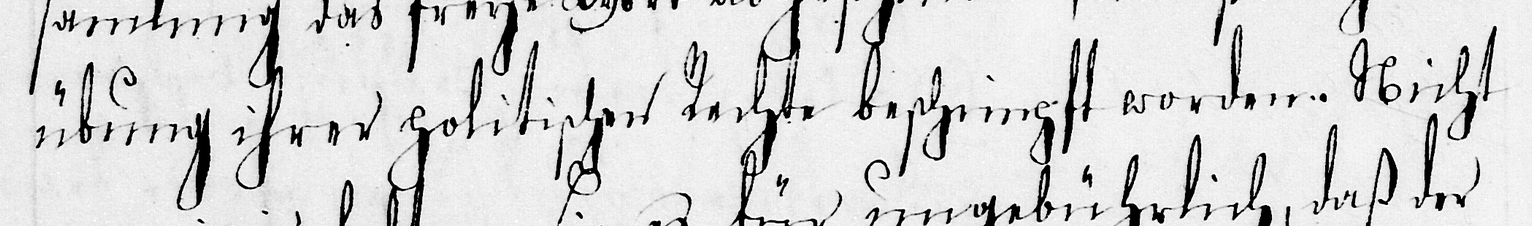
übung ihrer politischen Rechte beschimpft worden. Nicht
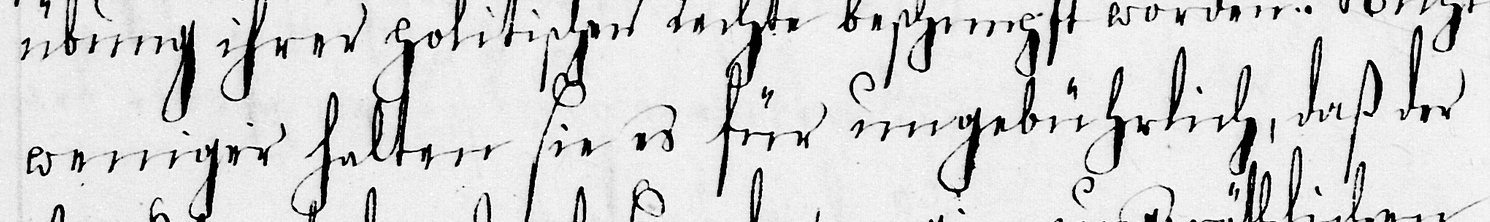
weniger halten sie es für ungebührlich, daß der
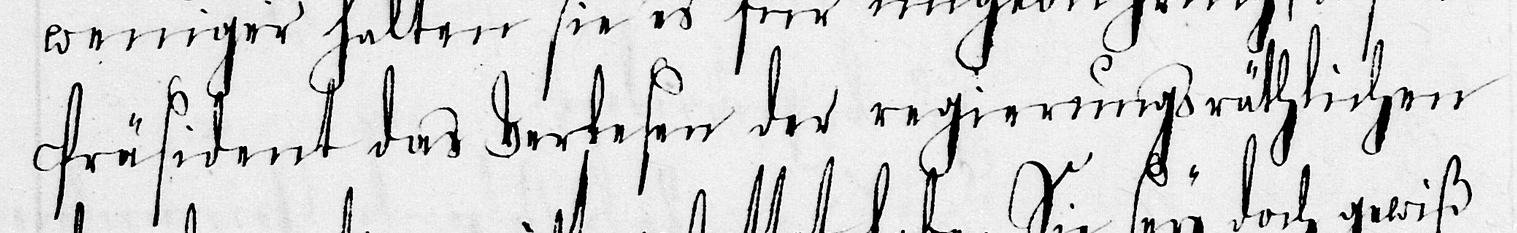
Präsident das Verlesen der regierungsräthlichen
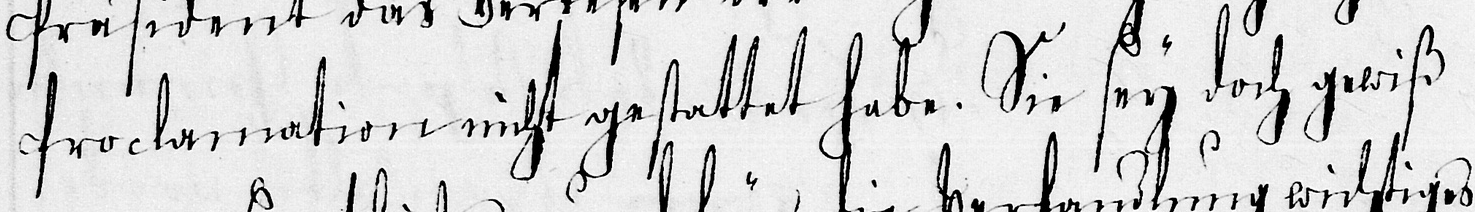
Proclamation nicht gestattet habe. Sie sey doch gewiß
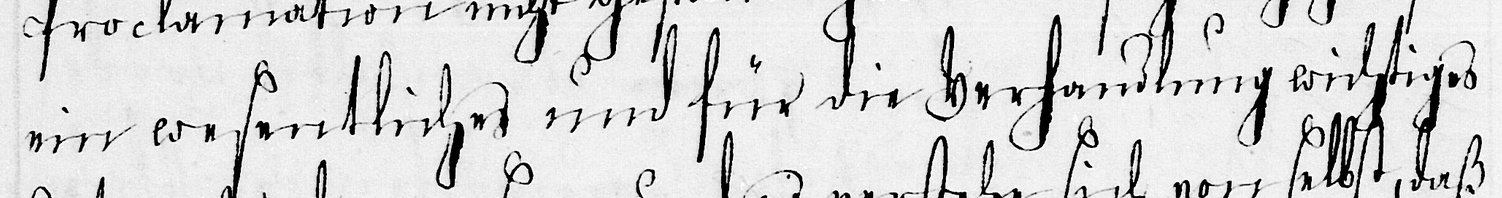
ein wesentliches und für die Verhandlung wichtiges
